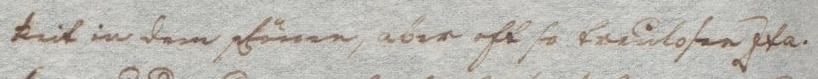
keit in dem schönen, aber oft so freudlosen Ita-
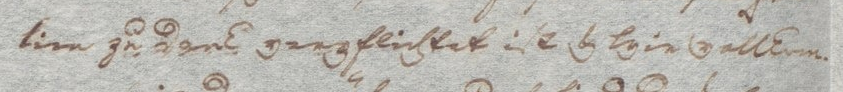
lien zu Dank verpflichtet ist & wie vollkom-
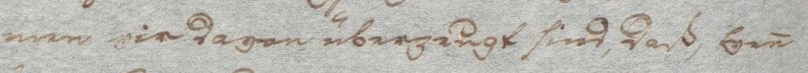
men wir davon überzeugt sind, daß, wenn
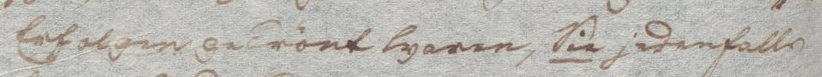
Erfolgen gekrönt waren, Sie jedenfalls
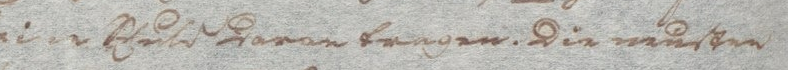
keine Schuld daran tragen. Die neusten
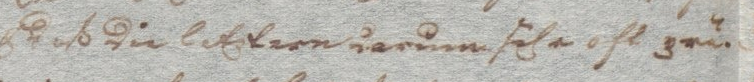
daß die letztern darum sehr oft prä-
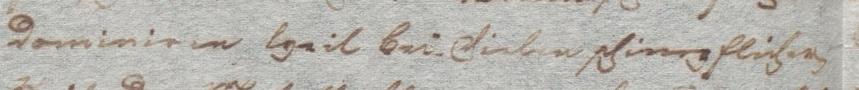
dominiren, weil bei Vielen schimpflicher
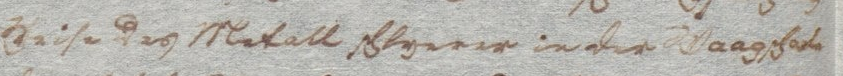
Weise das Metall schwerer in der Waagschale
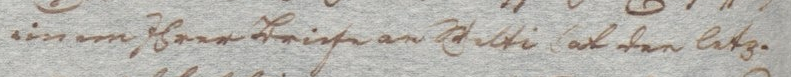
in einem Ihrer Briefe an Welti hat den letz-
